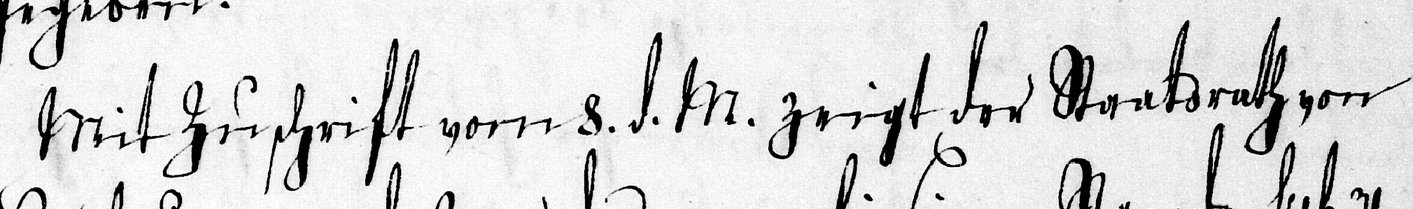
Mit Zuschrift vom 8. d. M. zeigt der Staatsrath von
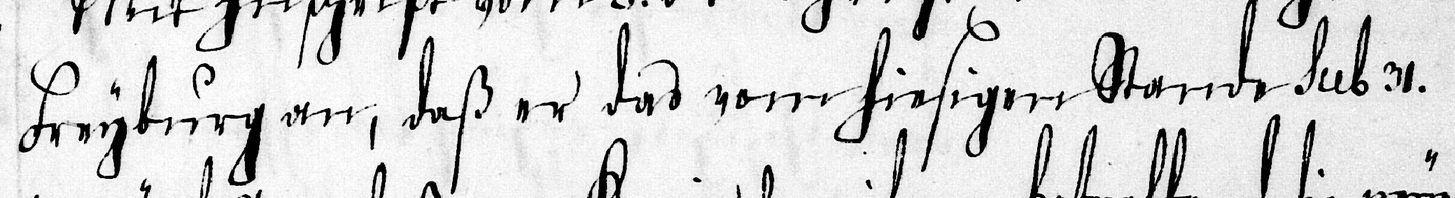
Freyburg an, daß er das vom hiesigen Stande sub 31.
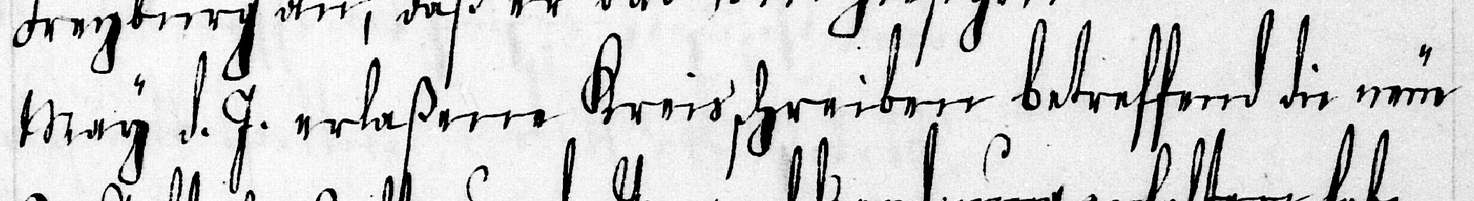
May d. J. erlaßene Kreisschreiben betreffend die neue
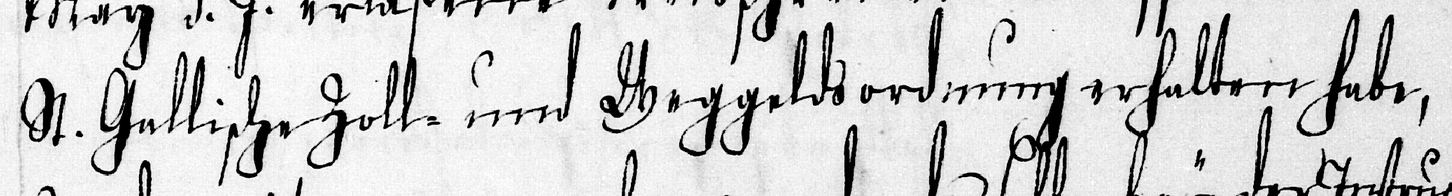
St. Gallische Zoll- und Weggeldsordnung erhalten habe,
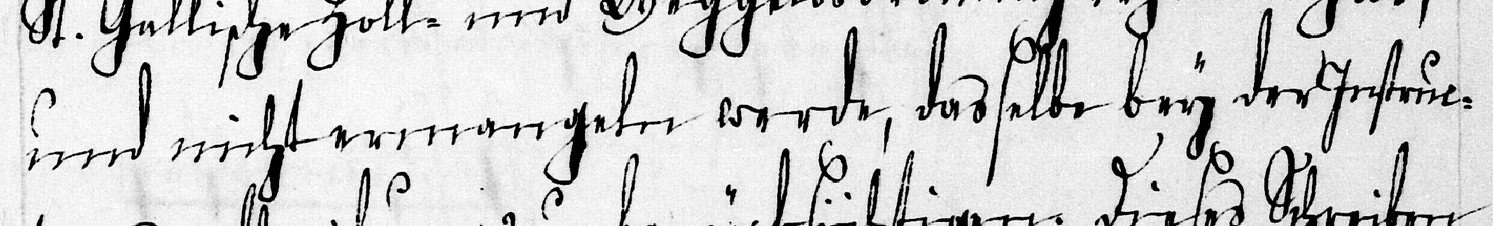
und nicht ermangeln werde, dasselbe bey der Instruc¬
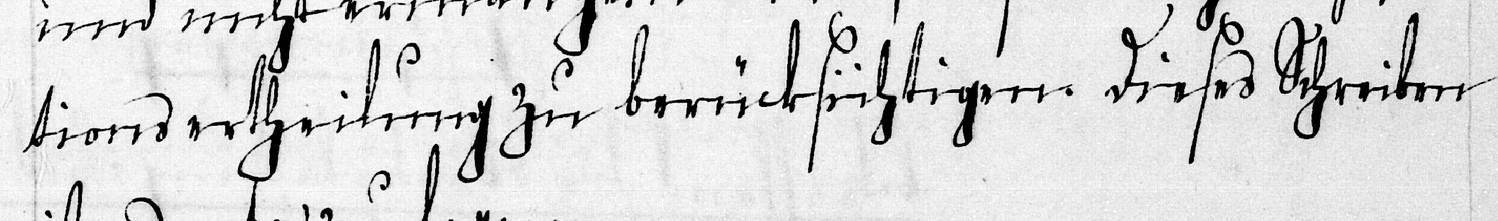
tionsertheilung zu berücksichtigen. Dieses Schreiben
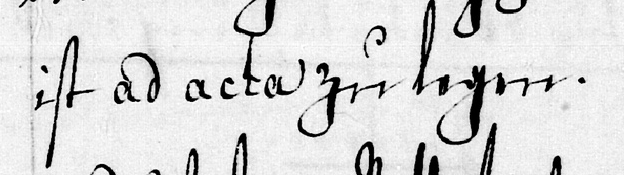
ist ad acta zu legen.
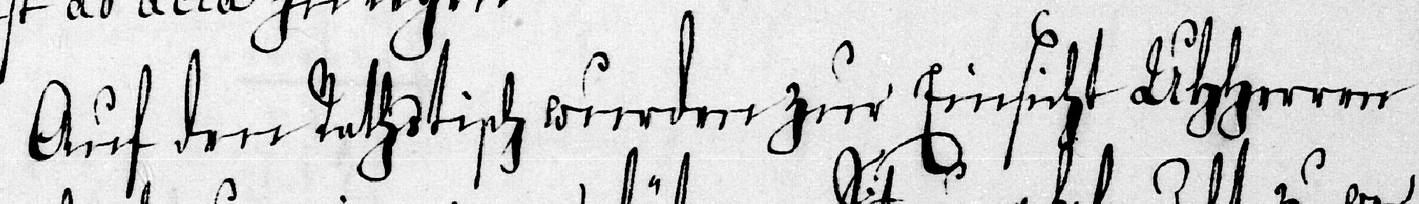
Auf den Rathstisch wurden zur Einsicht UHHerren
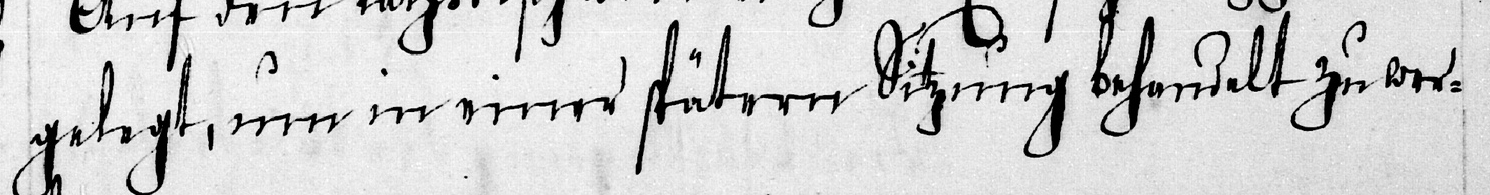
gelegt, um in einer spätern Sitzung behandelt zu wer¬
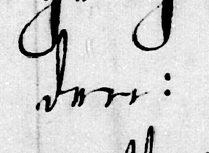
den:
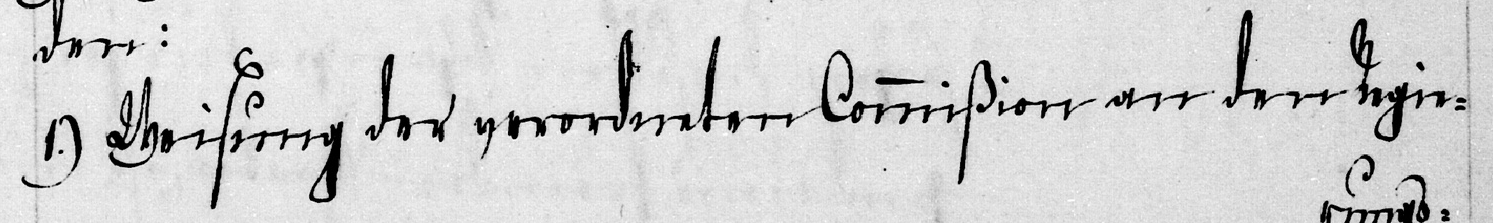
1.) Weisung der verordneten Commißion an den Regie-
